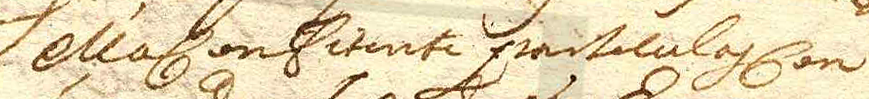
ella Confitente particulas Con
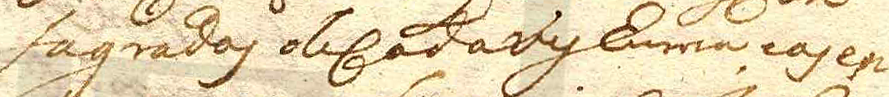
sagradas de Cada ves huma, e as en
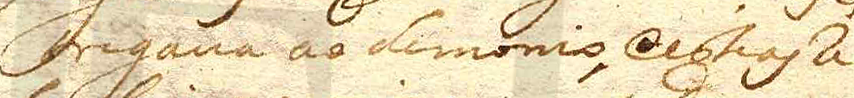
tregaua ao demonio, e este as Re
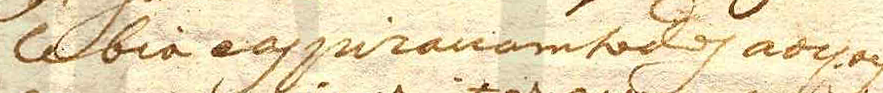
Cebia e as pizauam todos aos poes
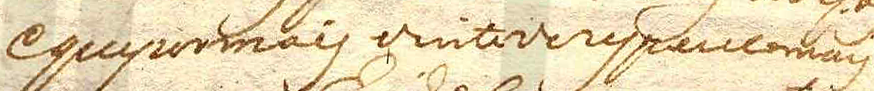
e que por mais vinte vezes pouco mais
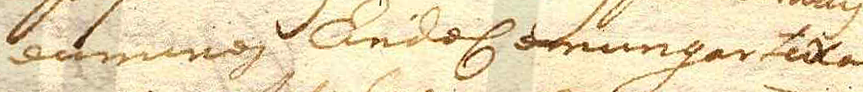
ou menos hindo Comungar teira
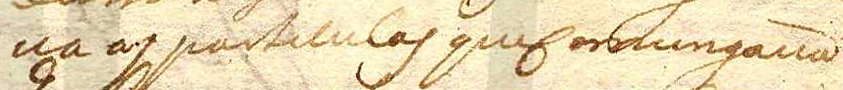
ua as particulas que Comungaua
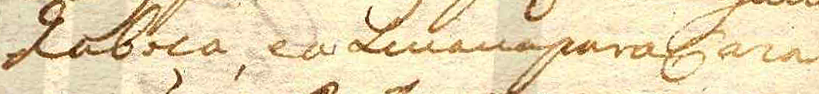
da boca, e a Leuaua para Caza
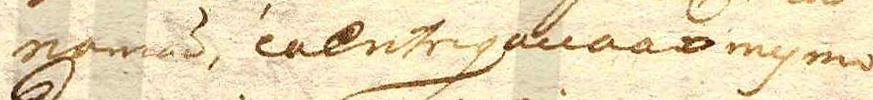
na maõ, e a entregaua ao mesmo
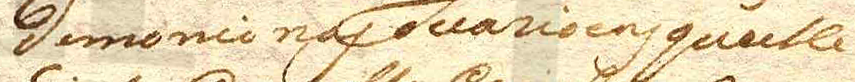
demonio nas occazioens que elle
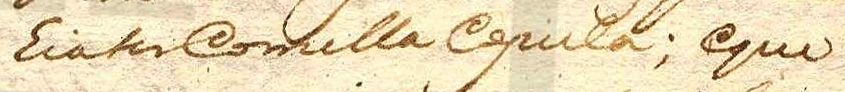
hia ter Com ella Copula; e que
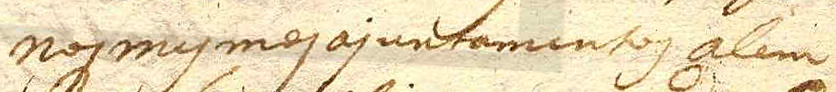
nos mesmos ajuntamentos alem
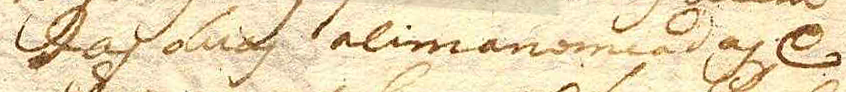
das duas acima nomeadas Co
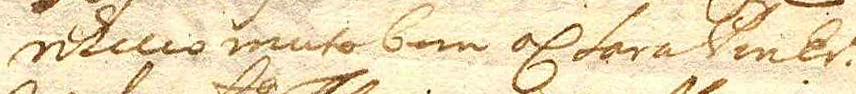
nheceo muto bem a Clara Pinhr.a
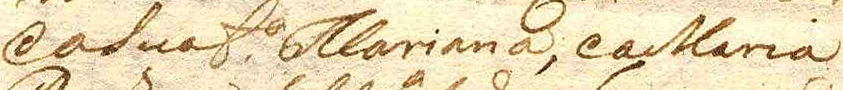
e a Sua f.a Mariana, e a Maria
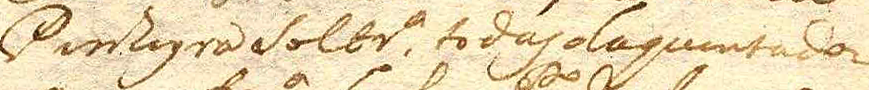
Pinheyra Soltr.a todas da quinta dos
